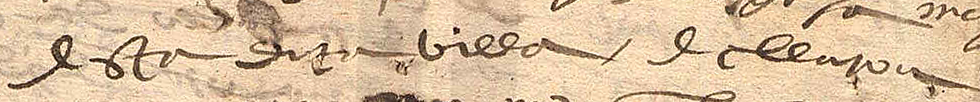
desta dita villa / decllarou
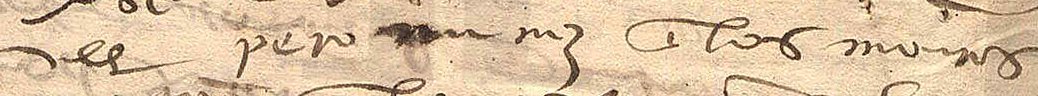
elle pero nunez q̄ hos mouros
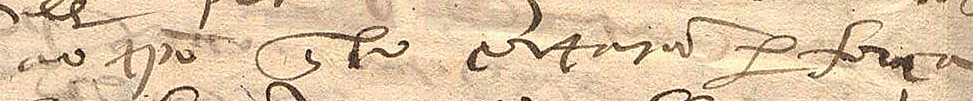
ao tp̄o q̄ ho cortarão ꝑ força
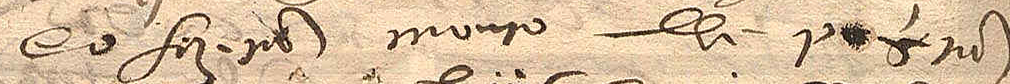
e o fizeraõ mouro lhe poseraõ
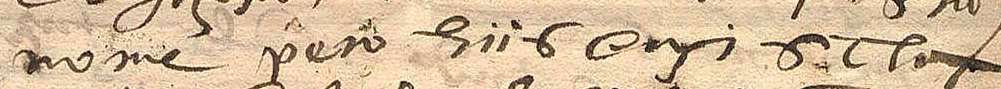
nome pero hiis e asi se cha
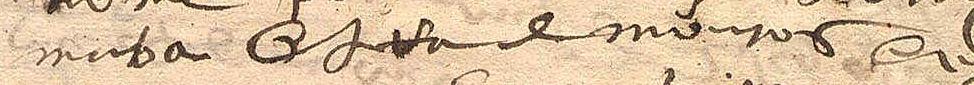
mava ē teRa de mouros e eu
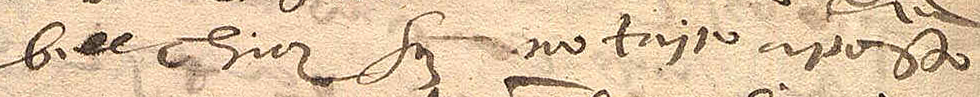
bellchior frz̄ notajro aposto
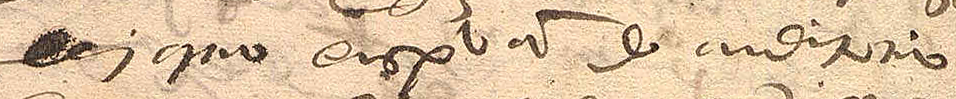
lljquo e espvaõ do auditorio
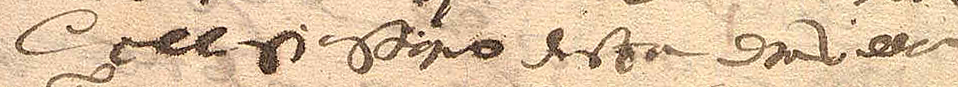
ecllesiastiquo desta dtā villa
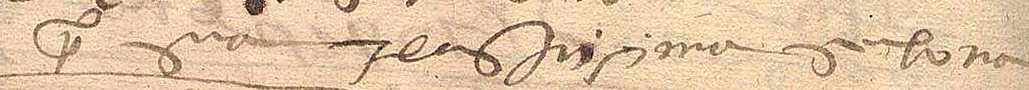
p̄o sua Jlustrisima senhoria
